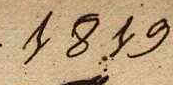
1819
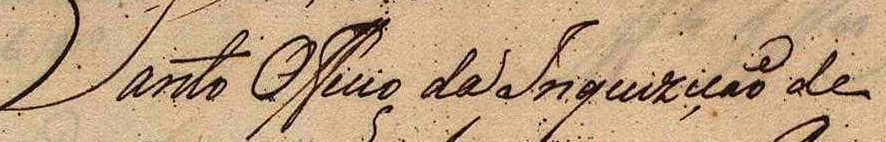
Santo Officio da Inquiziçaõ de
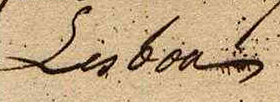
Lisboa
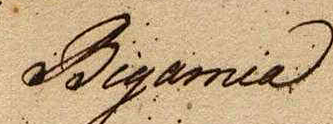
Bigamia
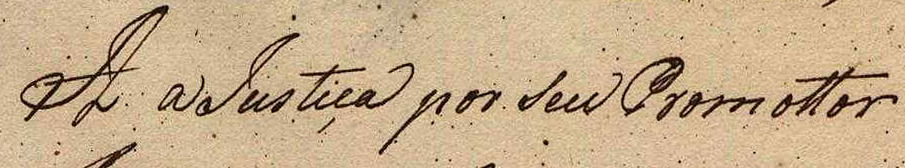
A. a Iustiça por seu Promottor
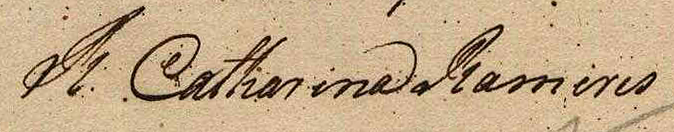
R. Catharina Ramires
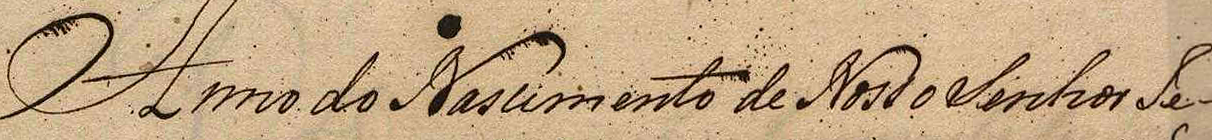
Anno do Nascimento de Nosso Senhor Ie
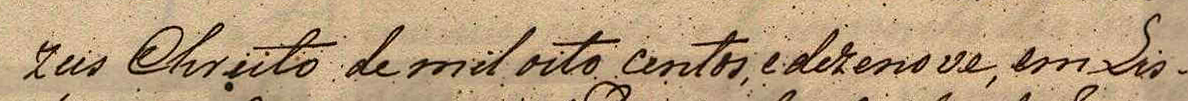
zus Christo de mil oitocentos, e dezenove, em Lis
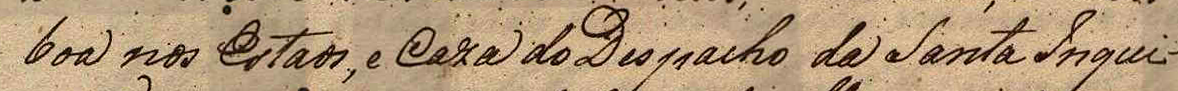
boa nos Estaos, e Caza do Despacho da Santa Inqui
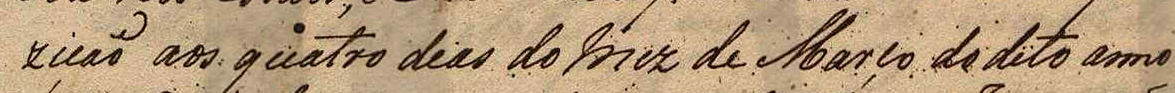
ziçaõ aos quatro dias do Mez de Março do dito anno
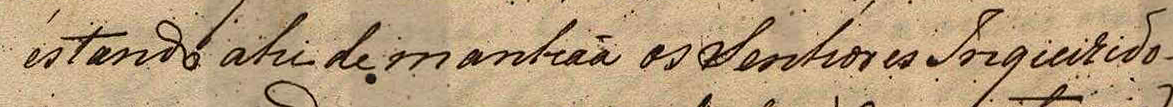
estando ahi de manhaã os Senhores Inquizido
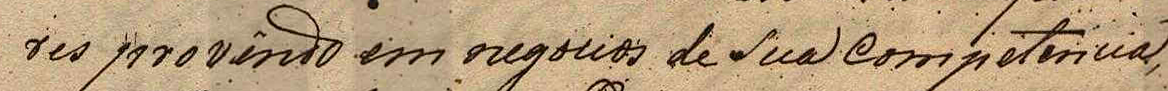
res provêndo em negocios de sua competencia,
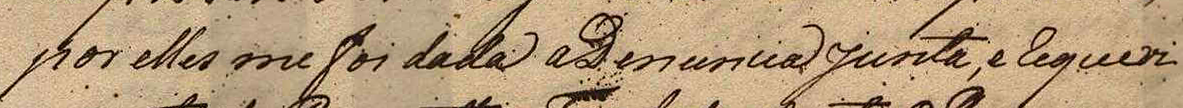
por elles me foi dada a Denuncia junta, e Requeri
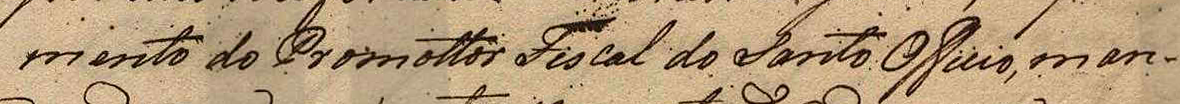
mento do Promottor Fiscal do Santo Officio, man
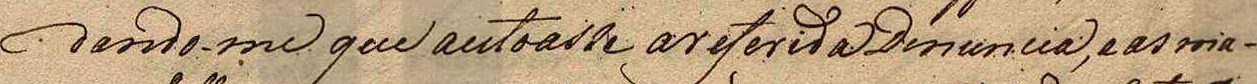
dando-me que autoasse a referida Denuncia, e as ma
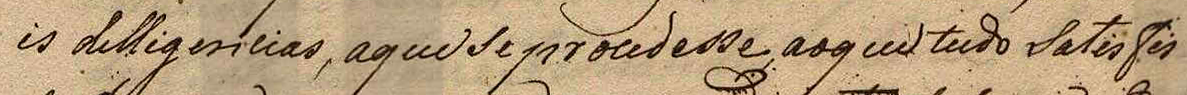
is dilligencias, a que se procedesse, ao que tudo satisfis
